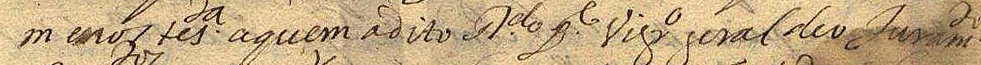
menos testa a quem o dito R.do p.e Vigro geral deo Juram.to
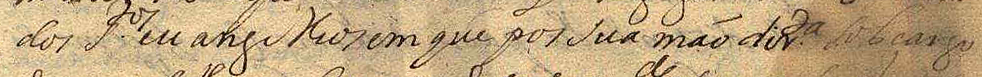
dos S.tos euangelhos em que pos sua maõ dir.ta sob cargo
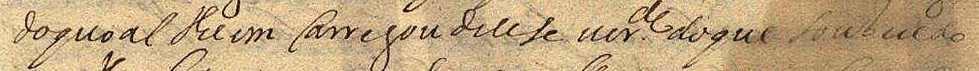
do quoal lhe emCarregou dicese uer.de do que soubece do
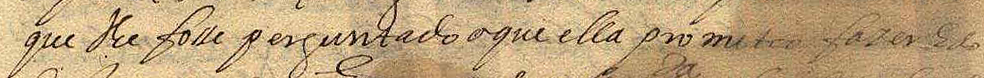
que lhe fosse perguntado o que ella prometeo fazer E do
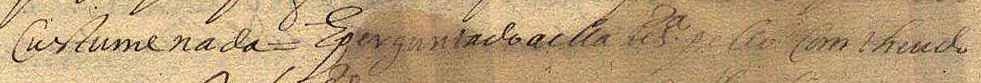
Custume nada = E perguntado a ella tes.ta pello Comtheudo
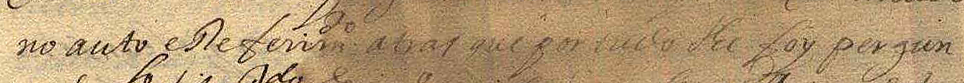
no auto e Referimto atras que por tudo lhe foy pergun
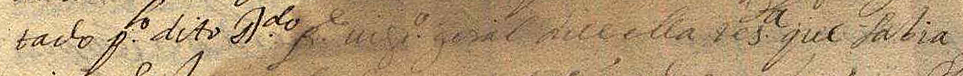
tado p.lo dito R.do p.e uigr.o geral dice ella tes.ta que sabia
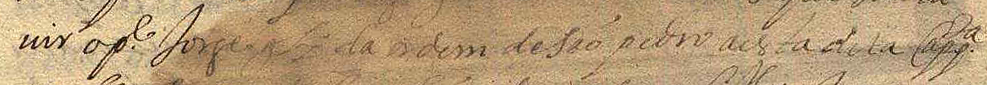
uir o p.e Jorge glz̄ da ordem de Saõ pedro a esta dita Cappta
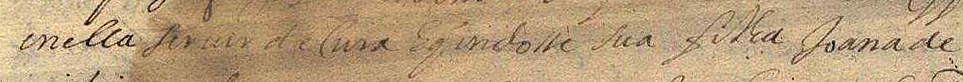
e nella seruir de Cura E q̄ indosse sua filha Joana de
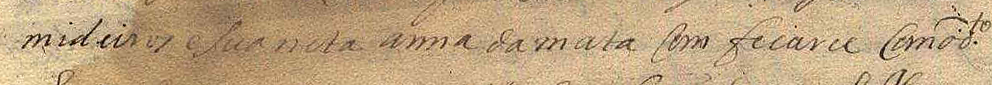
mideiros e sua neta anna da mata Comfeçarce Com o d.o
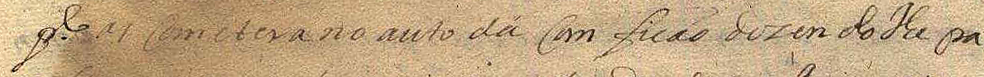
p.e as Cometera no auto da Comfiçaõ dizendolhe pa
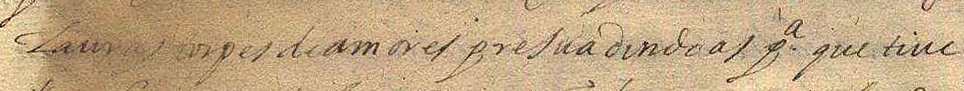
lauras torpes de amores presuadindo as p.a que tiue
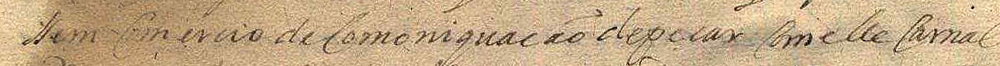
ssem Comercio de Comoniquaçaõ de pecar Com elle Carnal
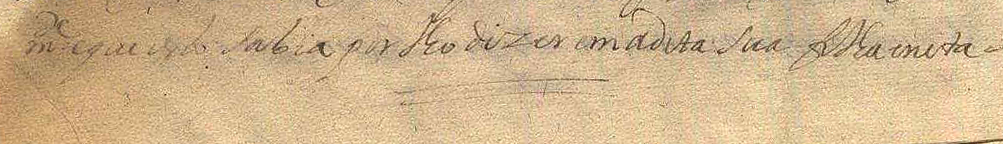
mte e que isto sabia por lho dizerem a dita sua filha e neta
